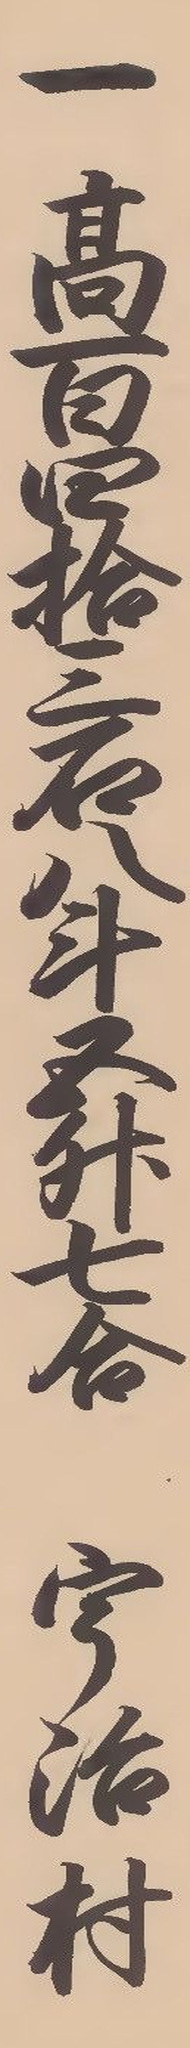一髙百四拾三石八斗五升七合宇治村
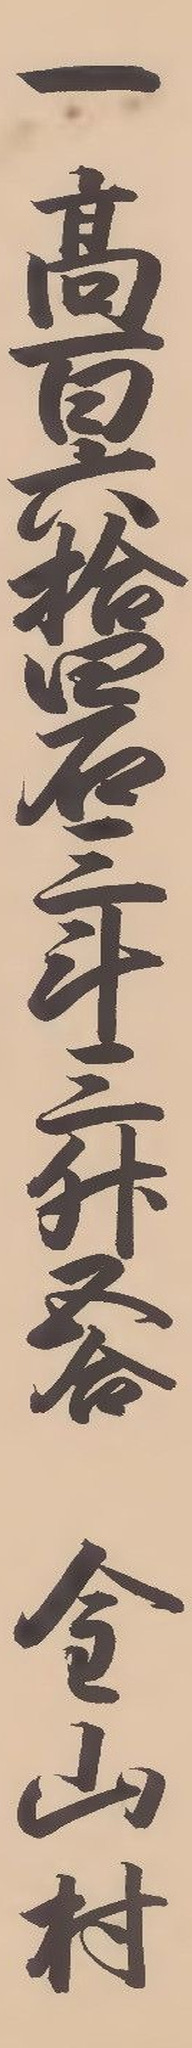一髙百六拾四石三斗三升五合金山村
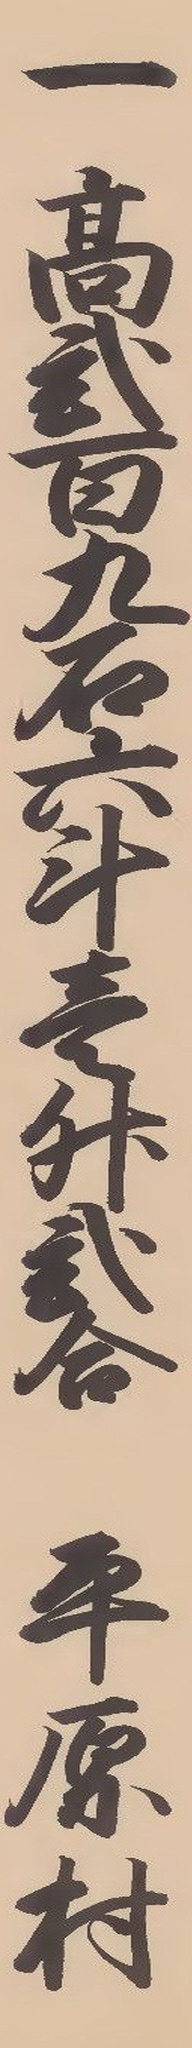一髙弐百九石六斗壱升弐合平原村
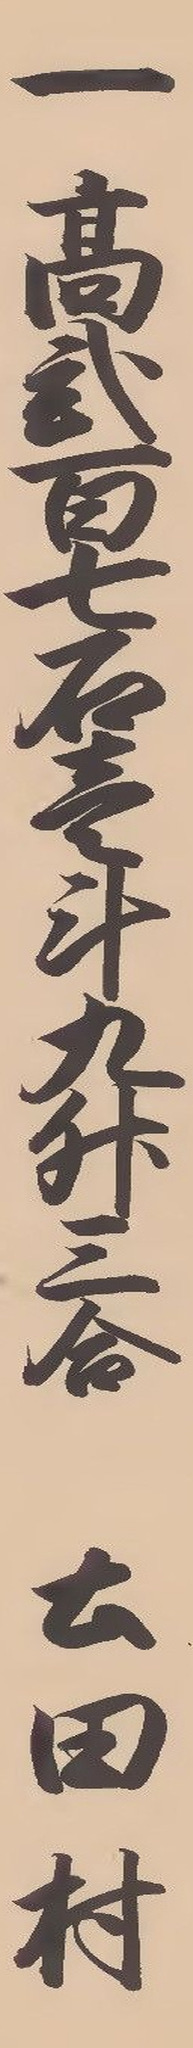一髙弐百七石壱斗九升三合土田村
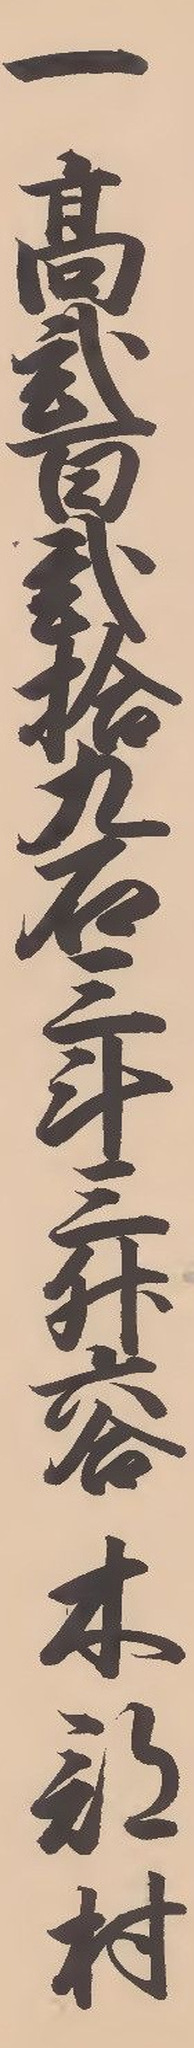一髙弐百弐拾九石三斗三升六合木部村
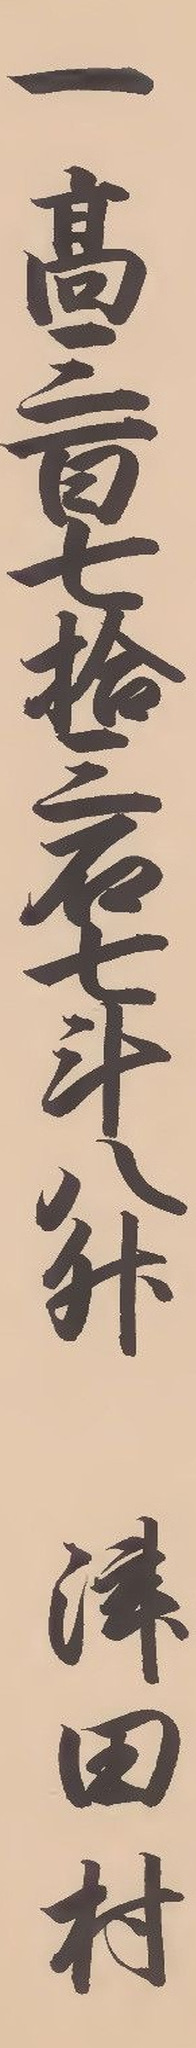一髙三百七拾三石七斗八升津田村
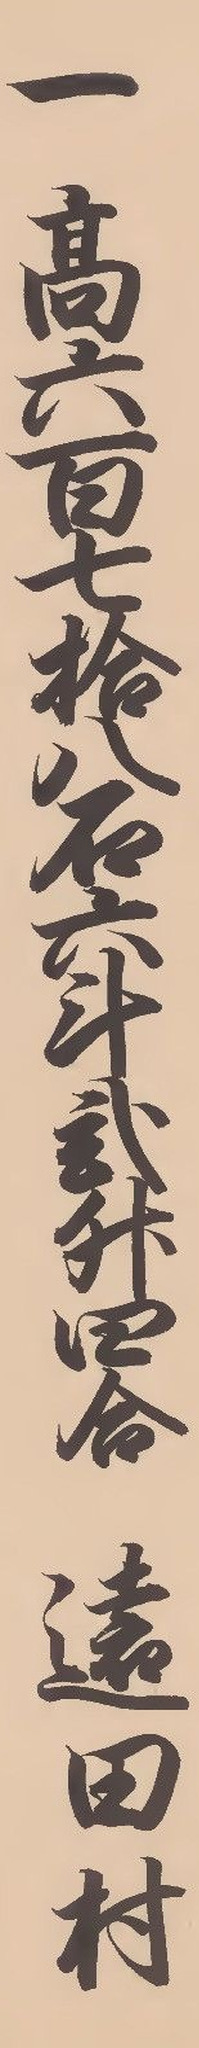一髙六百七拾八石六斗弐升四合遠田村
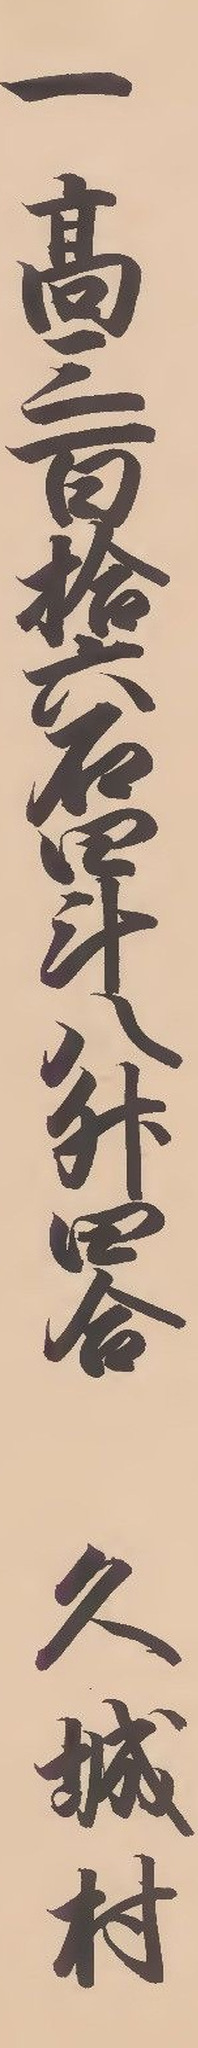一髙三百拾六石四斗八升四合久城村

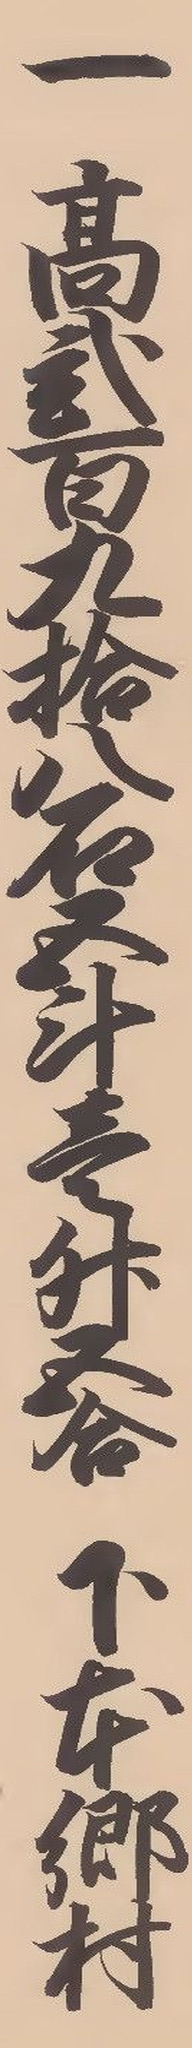一髙弐百九拾八石五斗壱升五合下本郷村
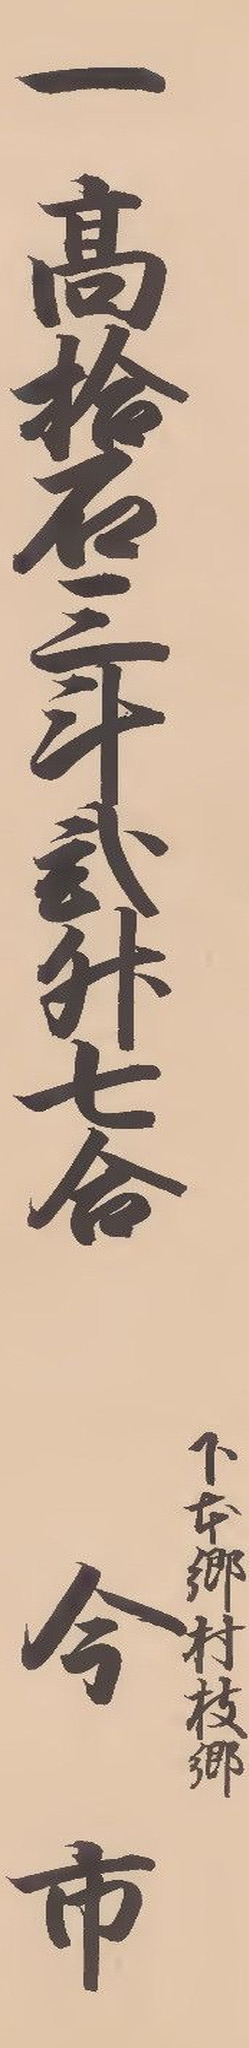一髙拾石三斗弐升七合今市
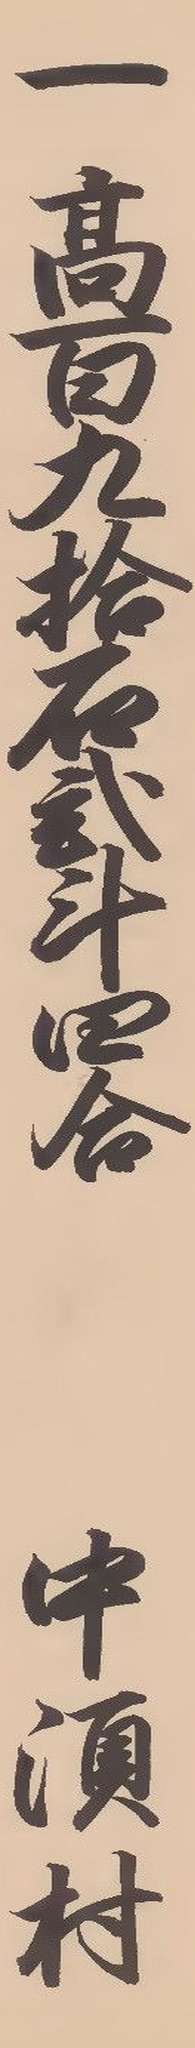一髙百九拾石弐斗四合中須村
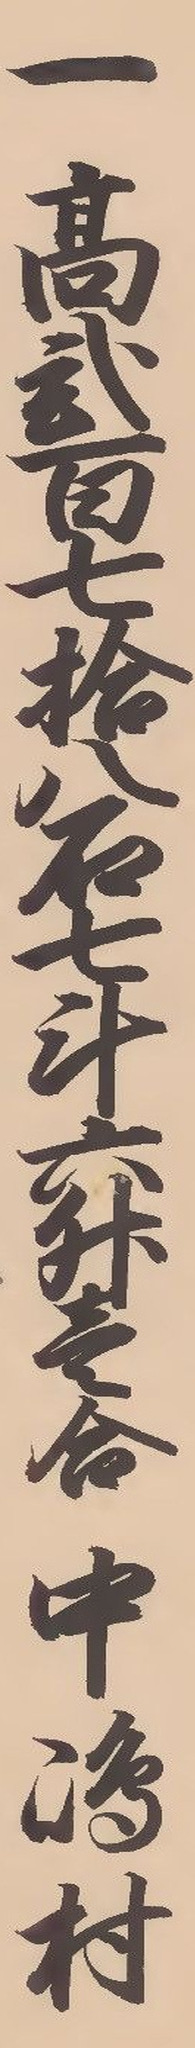一髙弐百七拾八石七斗六升壱合中嶋村
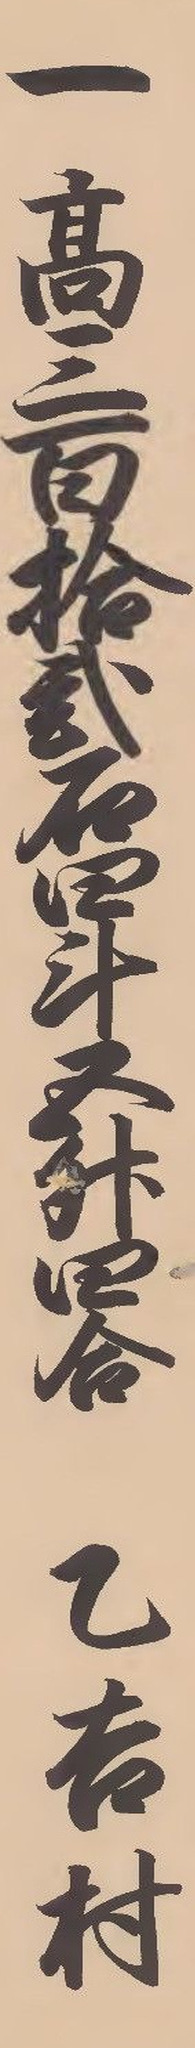一髙三百拾弐石四斗五升四合乙吉村
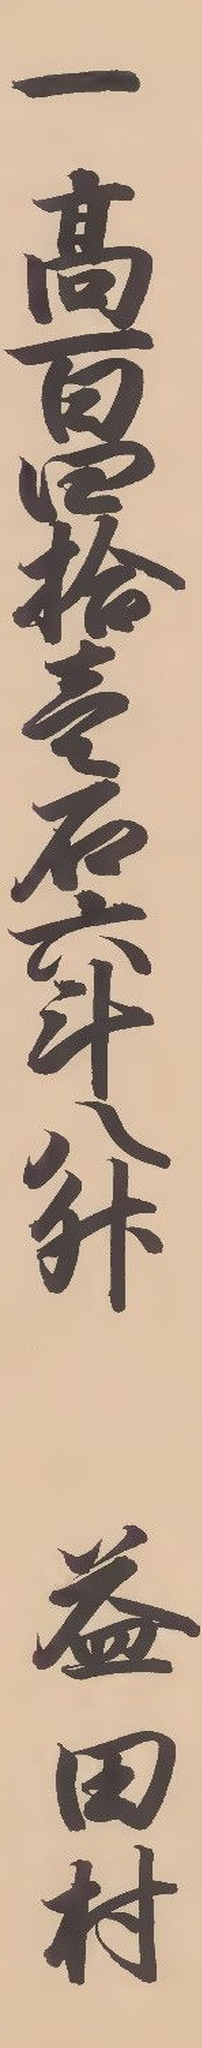一髙百四拾壱石六斗八升益田村
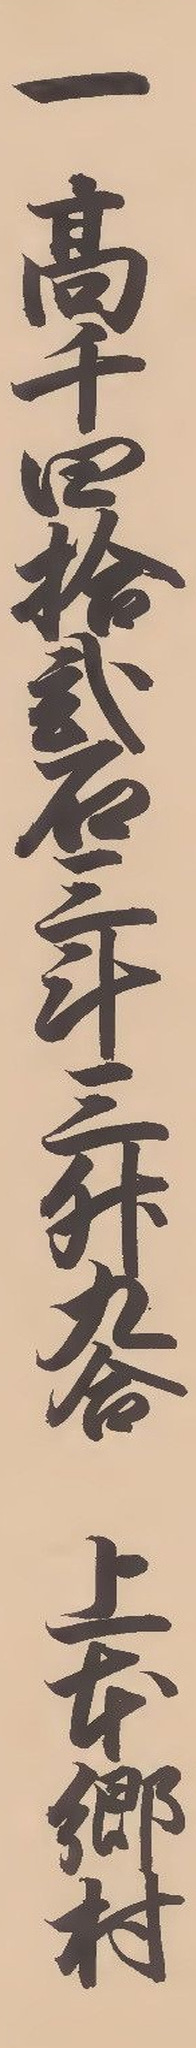一髙千四拾弐石三斗三升九合上本郷村
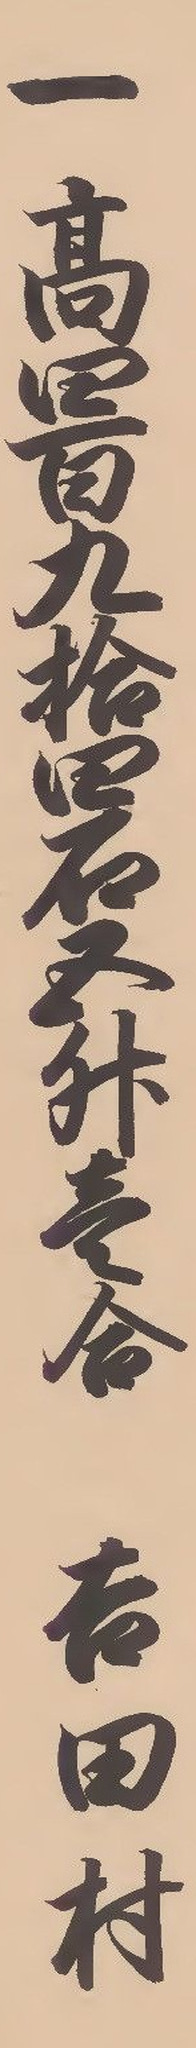一髙四百九拾四石五升壱合吉田村
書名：石見国郷帳
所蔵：国立公文書館 National Archives of Japan
